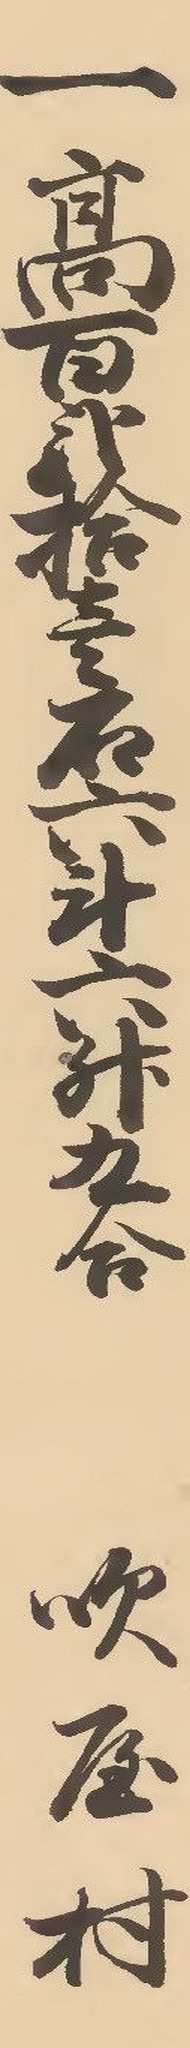一高百弐拾壱石六斗六升九合吹屋村
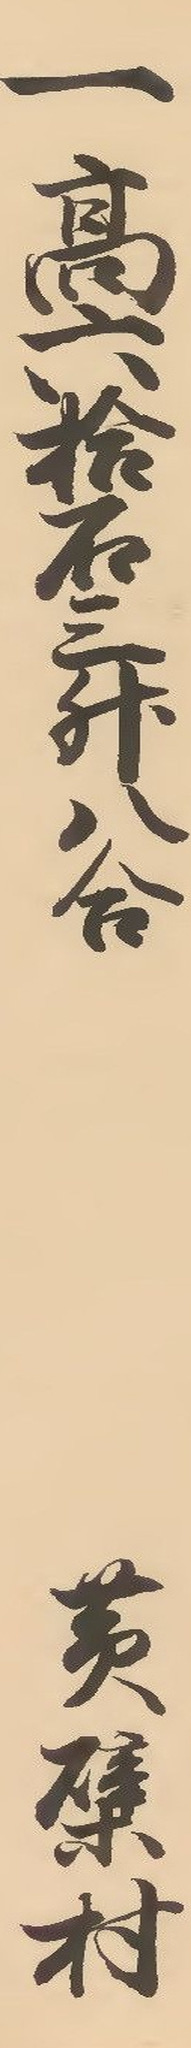一高六拾石三升八合黄檗村
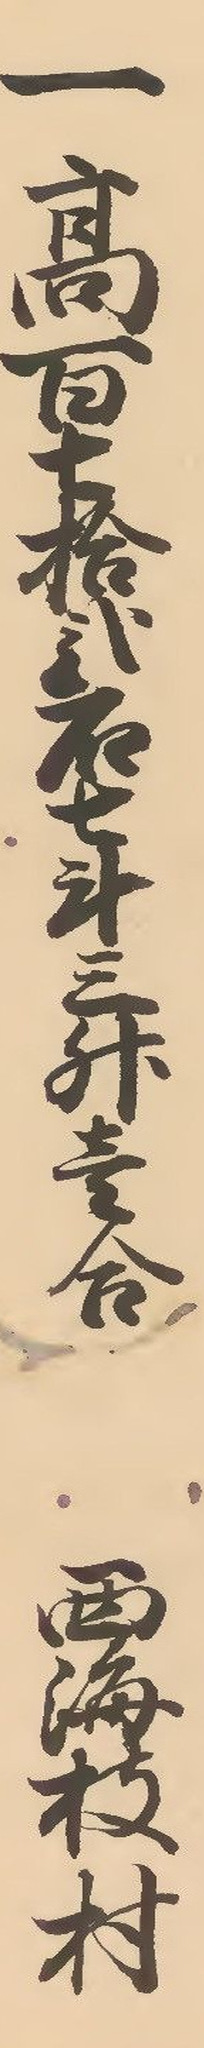一高百七拾弐石七斗三升壱合西海枝村

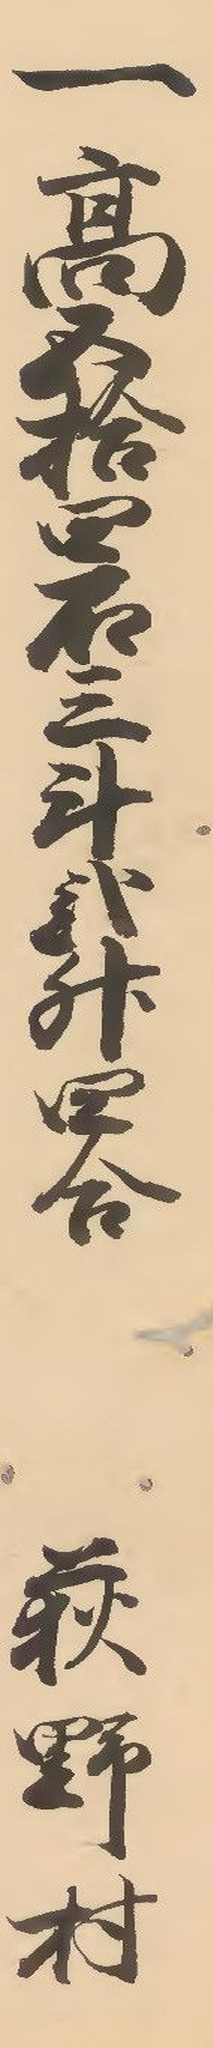一高五拾四石三斗弐升四合萩野村
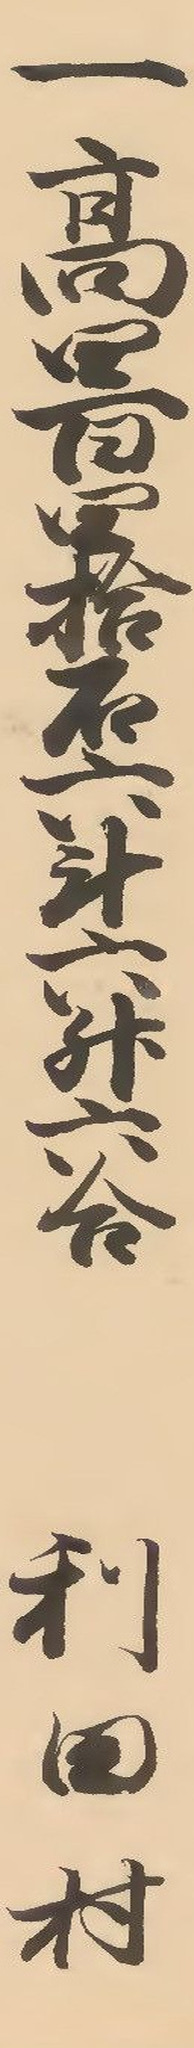一高四百四拾石六斗六升六合利田村
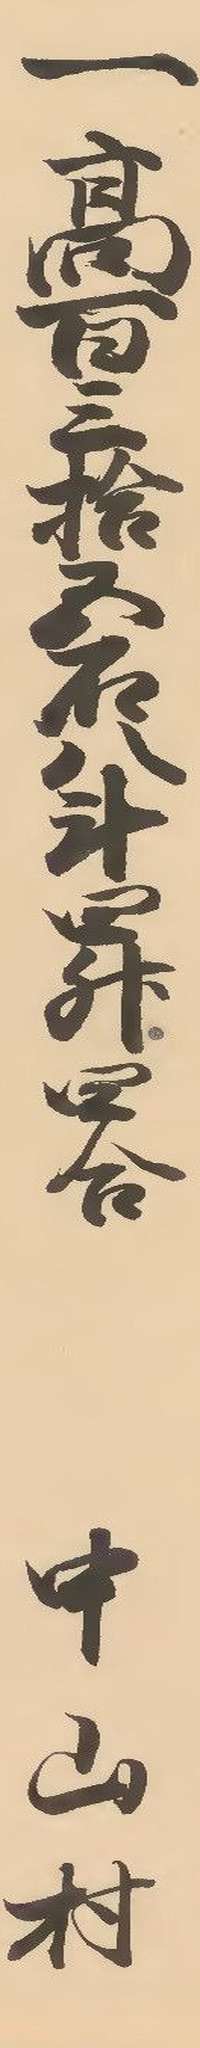一高百三拾五石八斗四升四合中山村
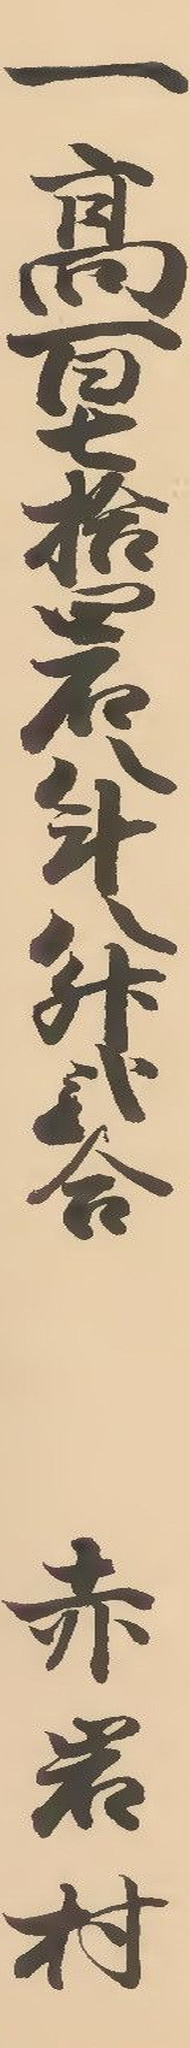一高百七拾四石八斗八升弐合赤岩村
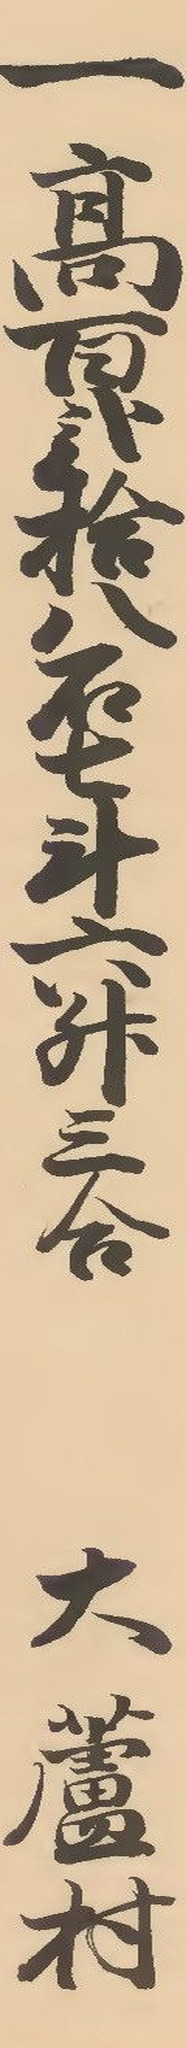一高百弐拾八石七斗六升三合大芦村
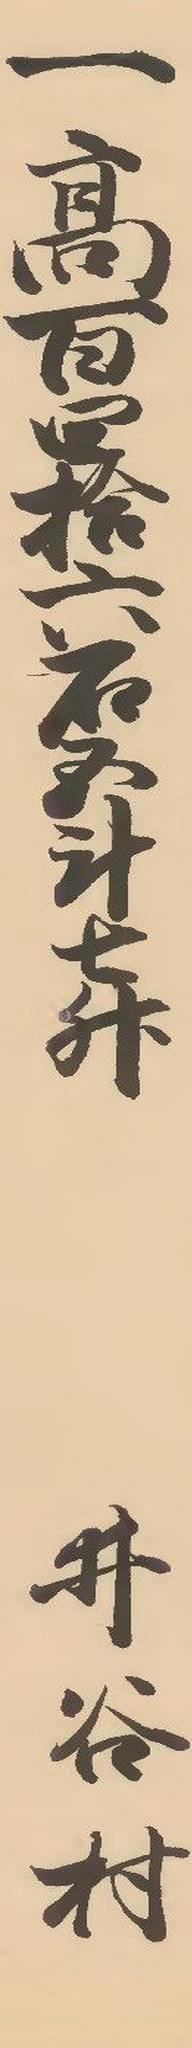一高百四拾六石五斗七升井谷村
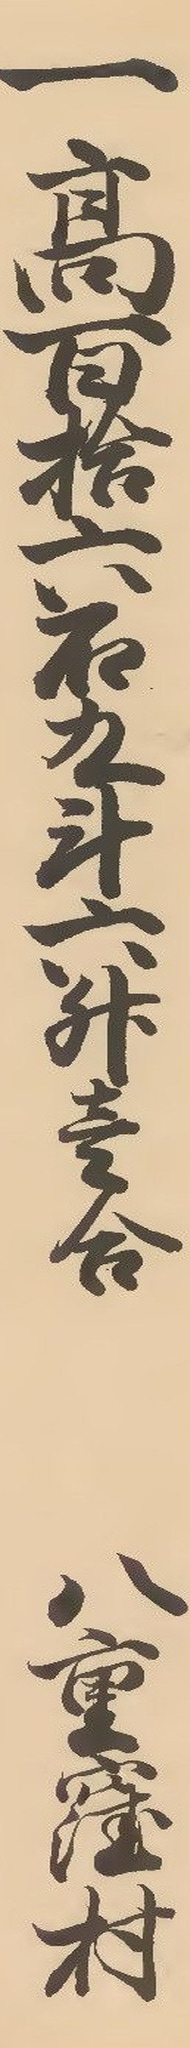一高百拾六石九斗六升壱合八重窪村
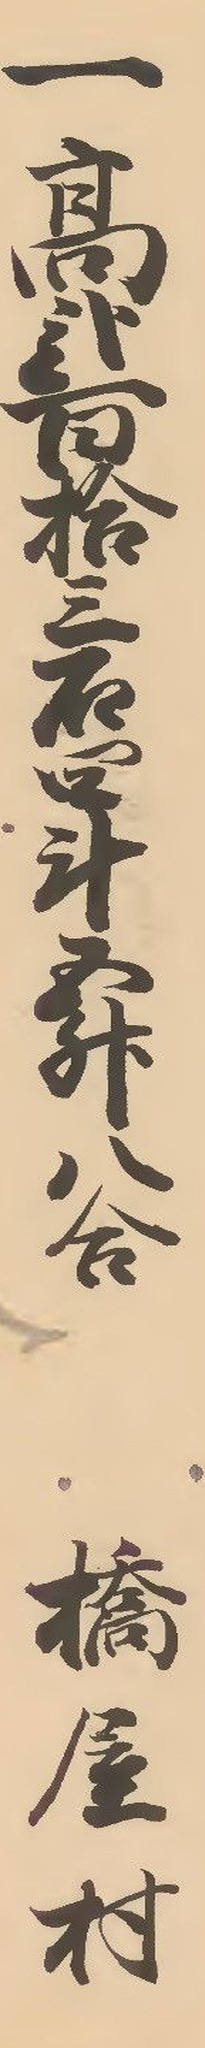一高弐百拾三石四斗五升八合橋屋村

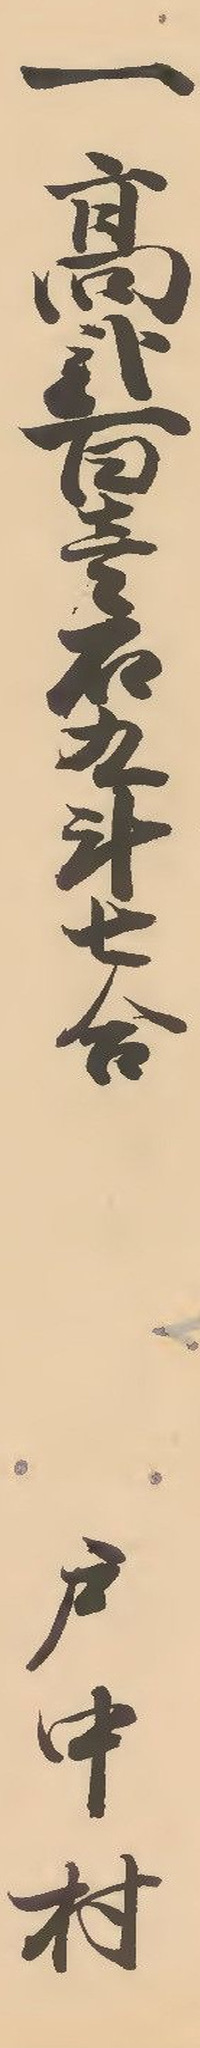一高弐百壱石九斗七合戸中村
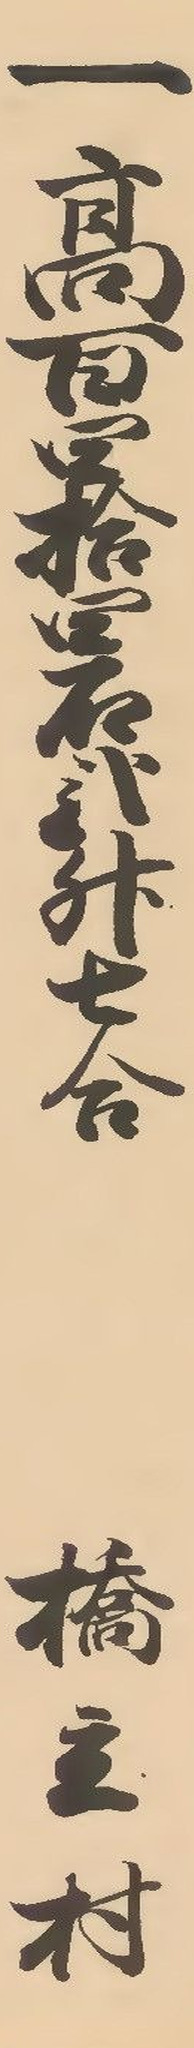一高百四拾四石弐升七合橋立村
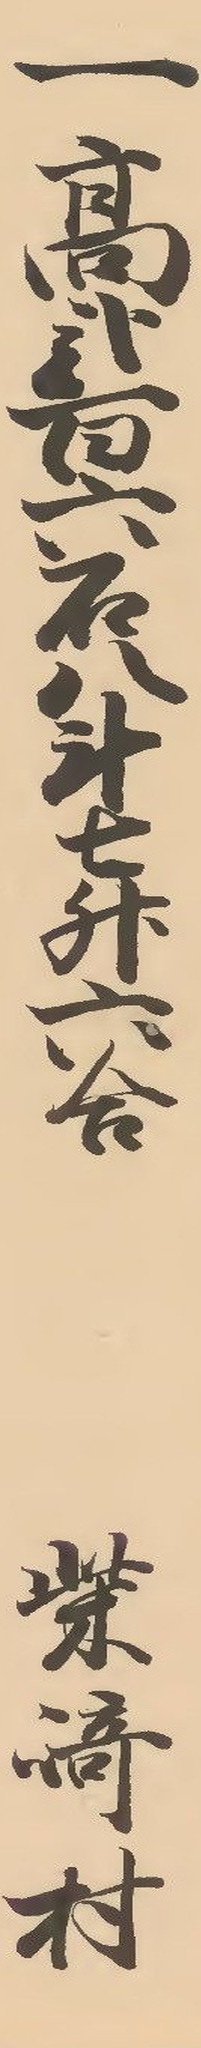一高弐百六石八斗七升六合柴崎村
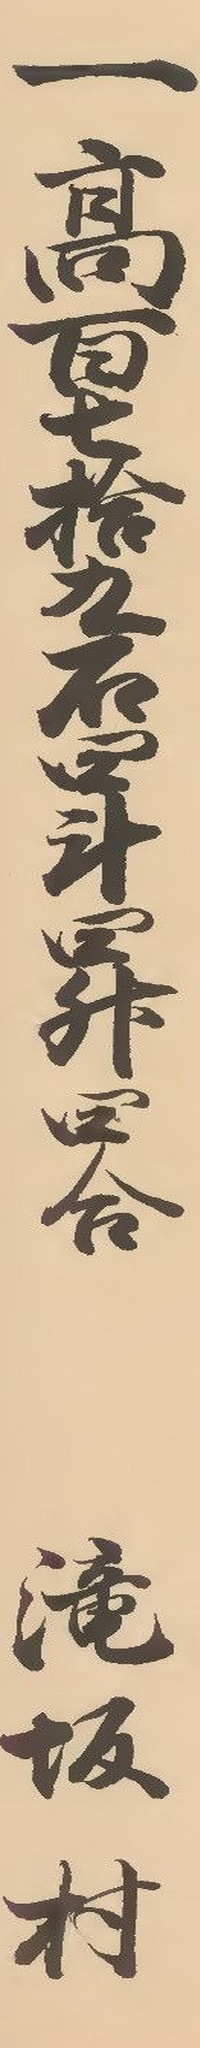一高百七拾九石四斗四升四合滝坂村
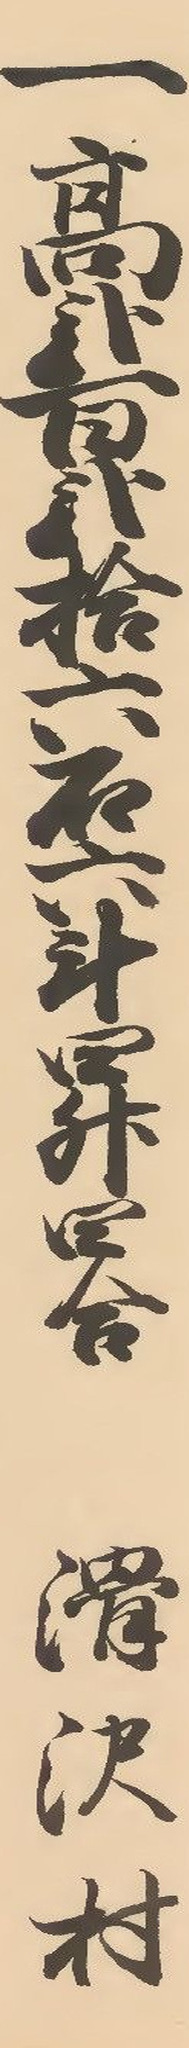一高弐百弐拾六石六斗四升四合滑沢村
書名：陸奥国郷帳　１
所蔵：国立公文書館 National Archives of Japan
